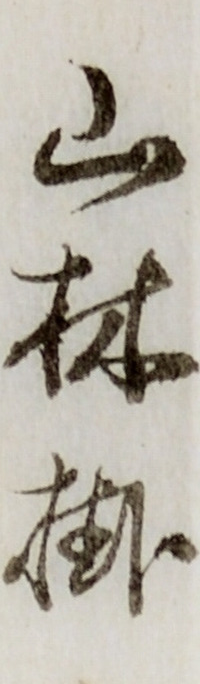山林方
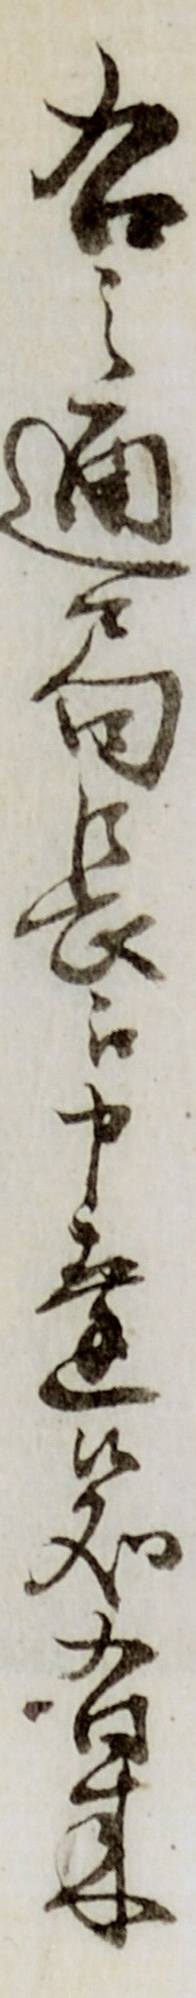右之通局長え申達候処有来
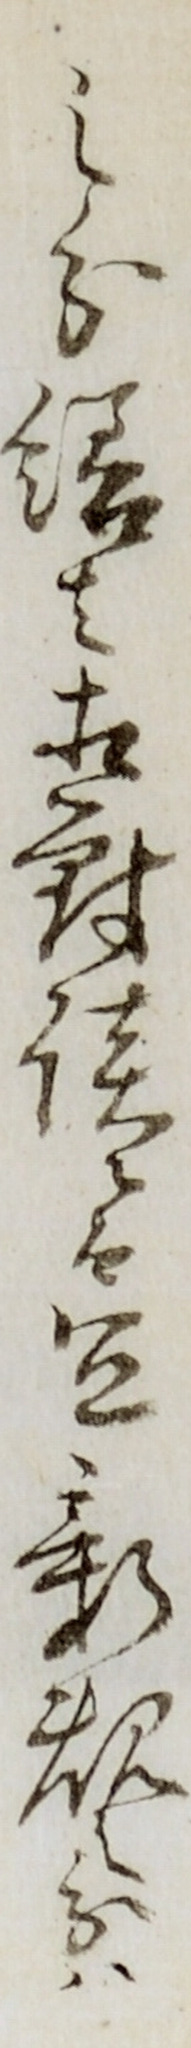之分繕は相対談にて宜新規之分は
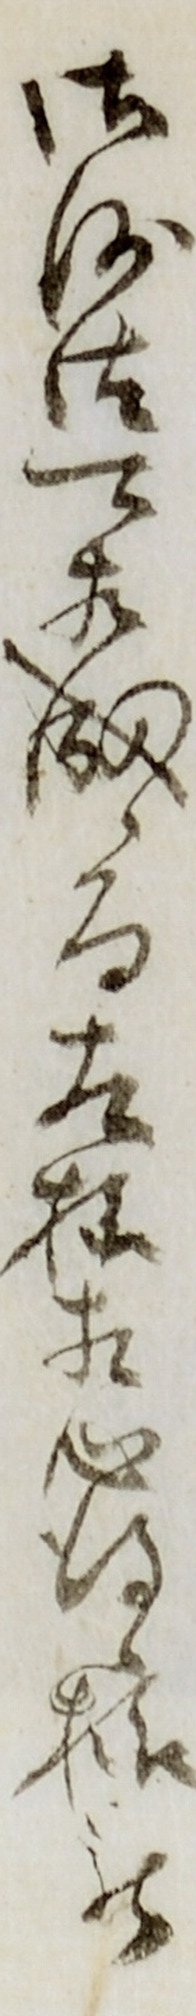御沙汰可相成候間左様相心得候様被
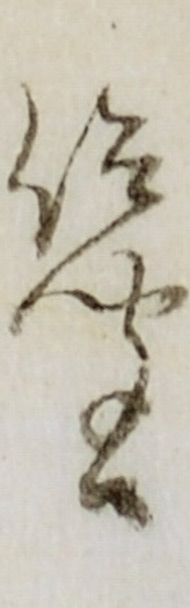仰聞候
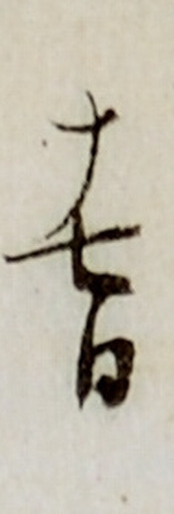十七日
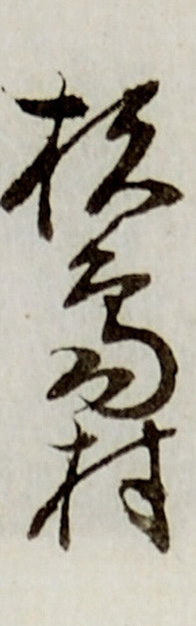杉島村
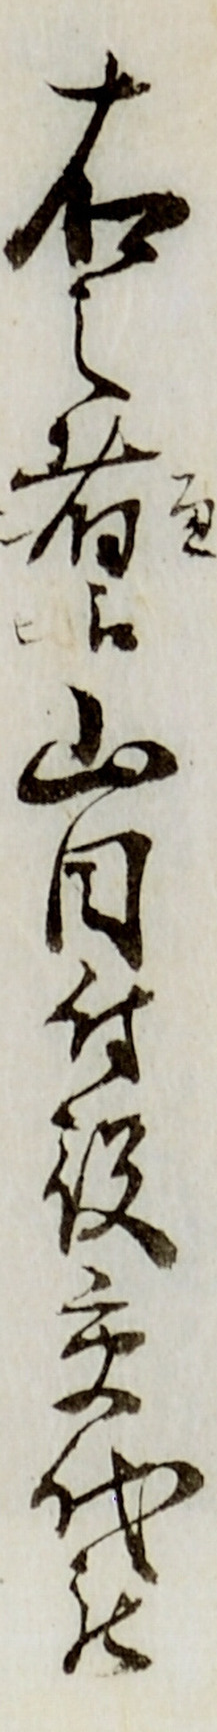右之者え山目付役交代被
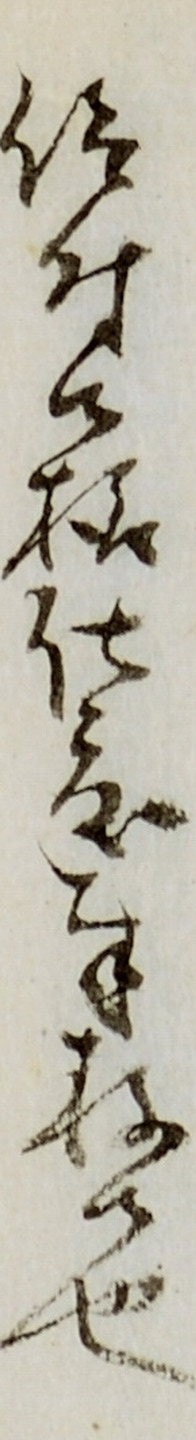仰出候様仕度奉存候也
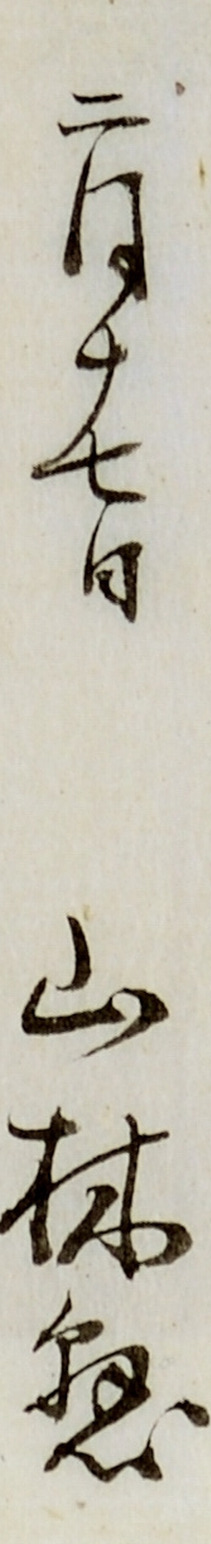二月十七日山林掛
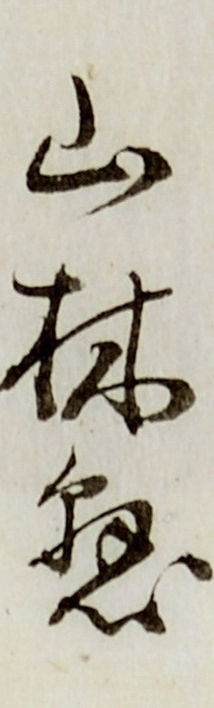山林方
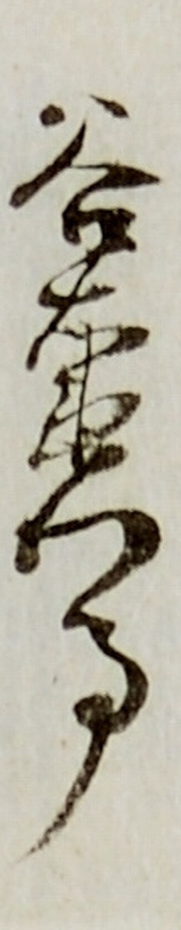谷右衛門事
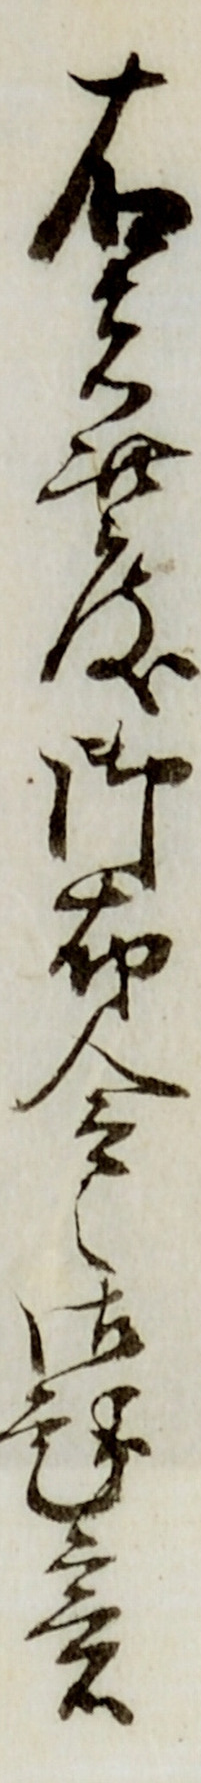右は此度御布令之御趣意
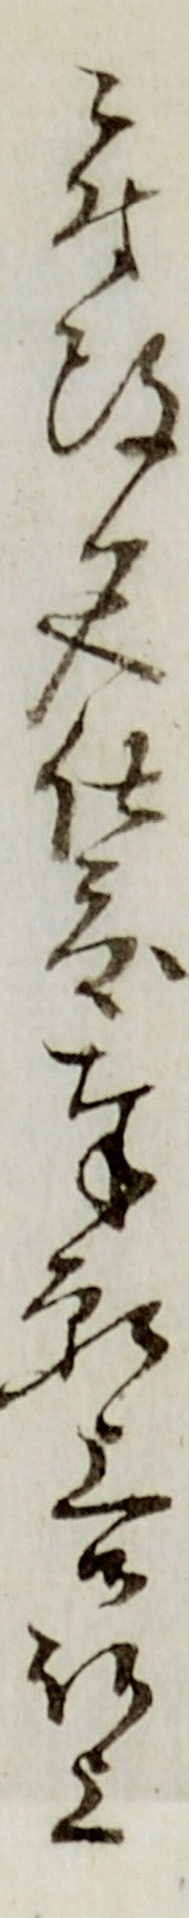に付改名仕度奉願上候以上
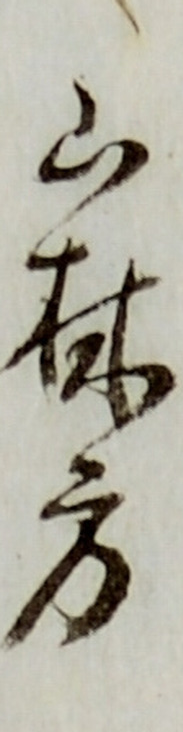山林方
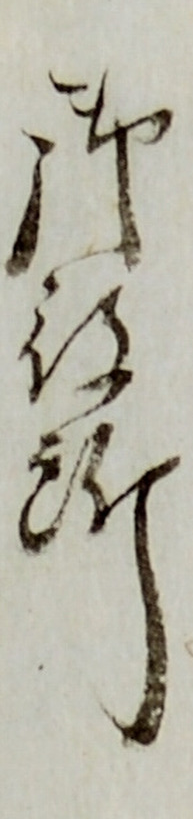御役所
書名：山林方諸事御用留
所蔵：伊那市立高遠町図書館・合同会社AMANE
